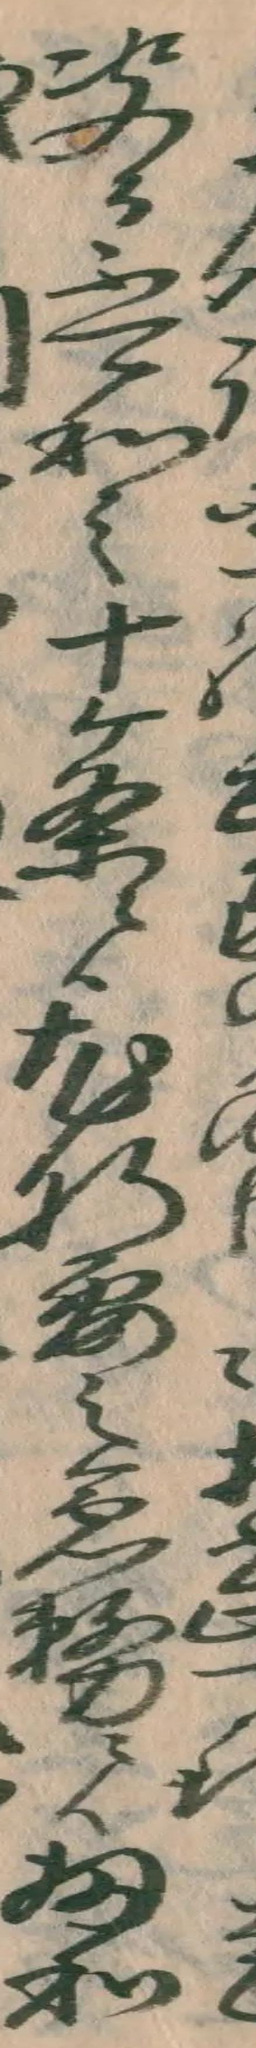決而不可和之十ケ条ニ候尤肝要之急務ニ候扠和
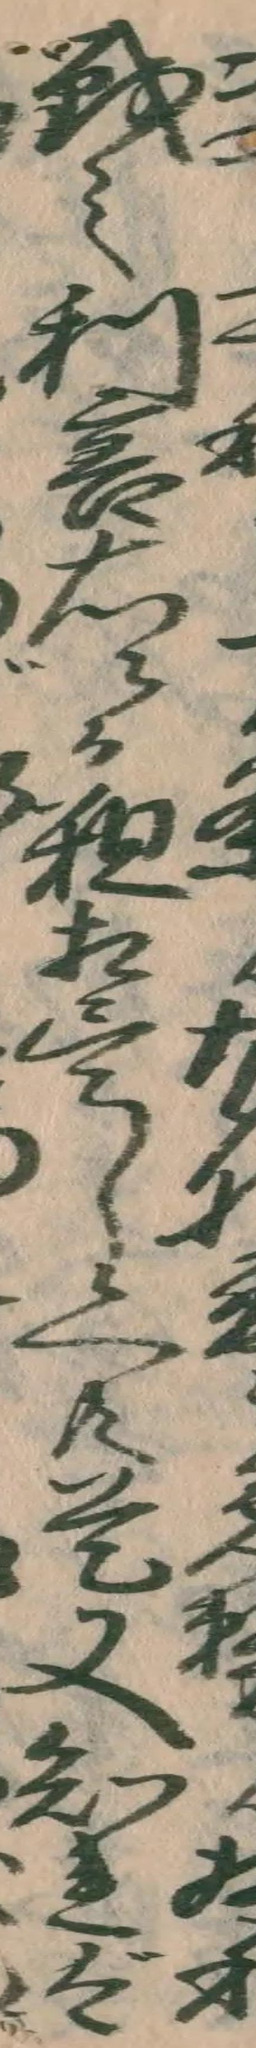戦之利害右ニ而粗相盡し候へ共是又知れば
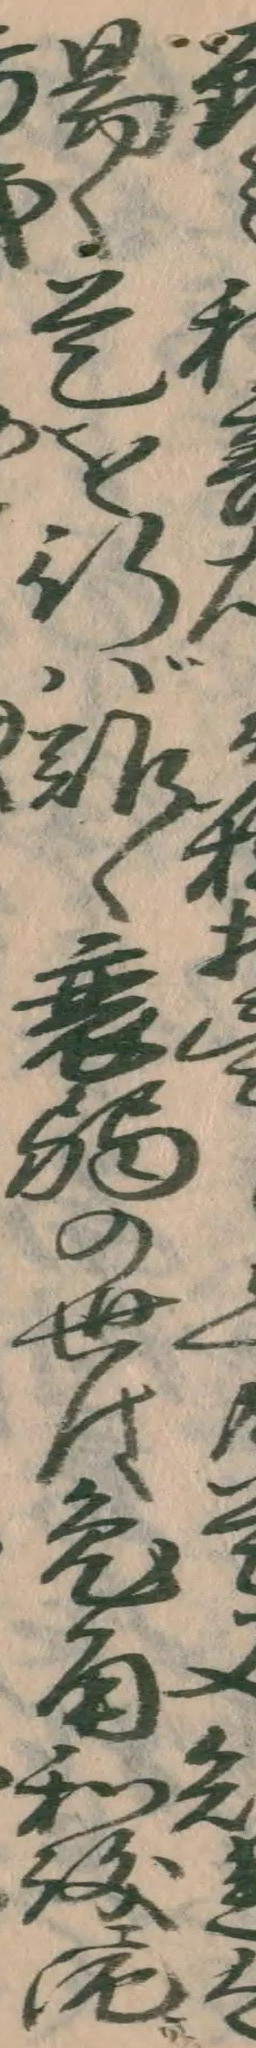易く是を行バ難く衰弱の世は兎角和議ニ泥
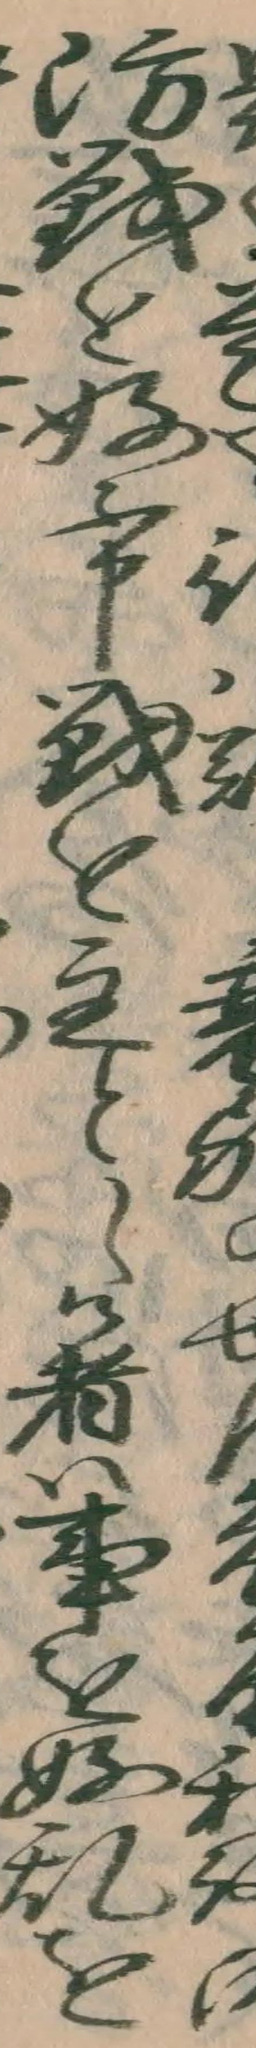防戦を好不申戦を主とし候者ハ事を好乱を
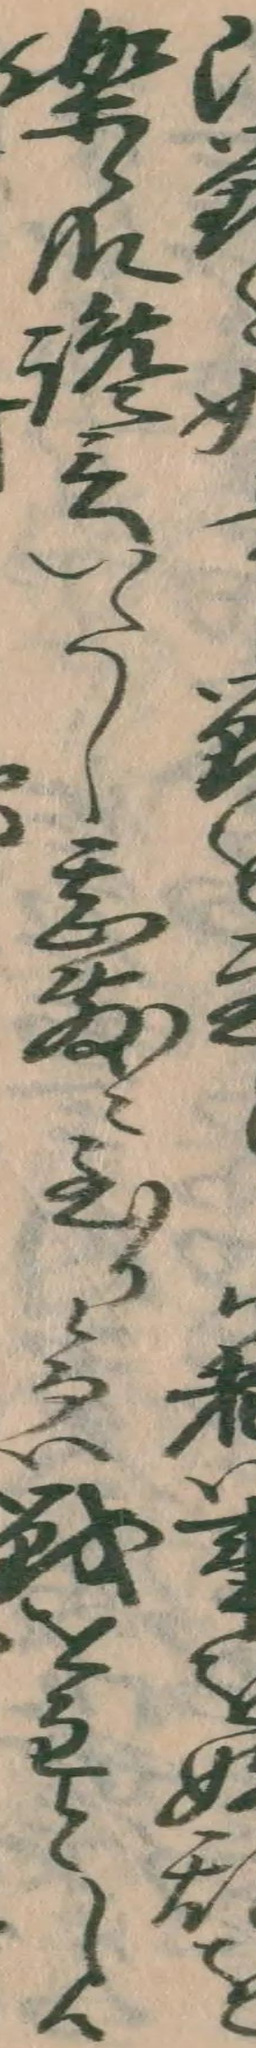楽候様讒言いたし甚敷ニ至り候而ハ戦を主とし候
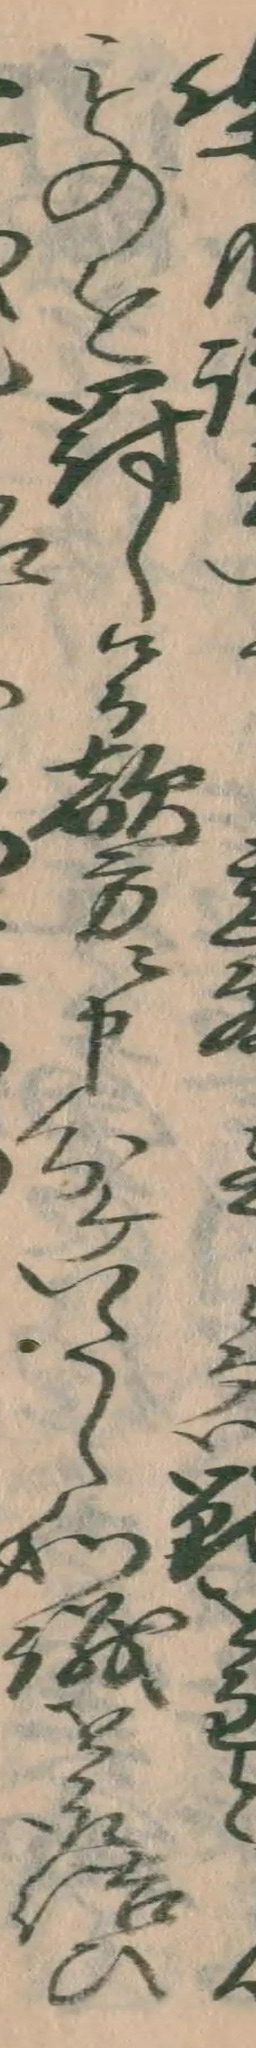ものを罰し候而敵方ニ申分ケいたし和議を取結ひ
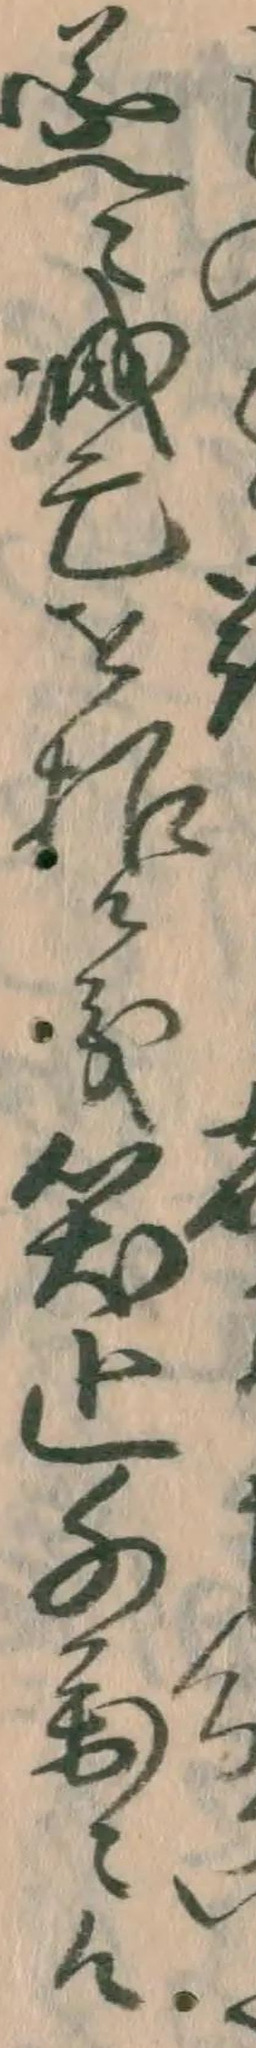遂ニ滅亡を招候義笑止千萬ニ候
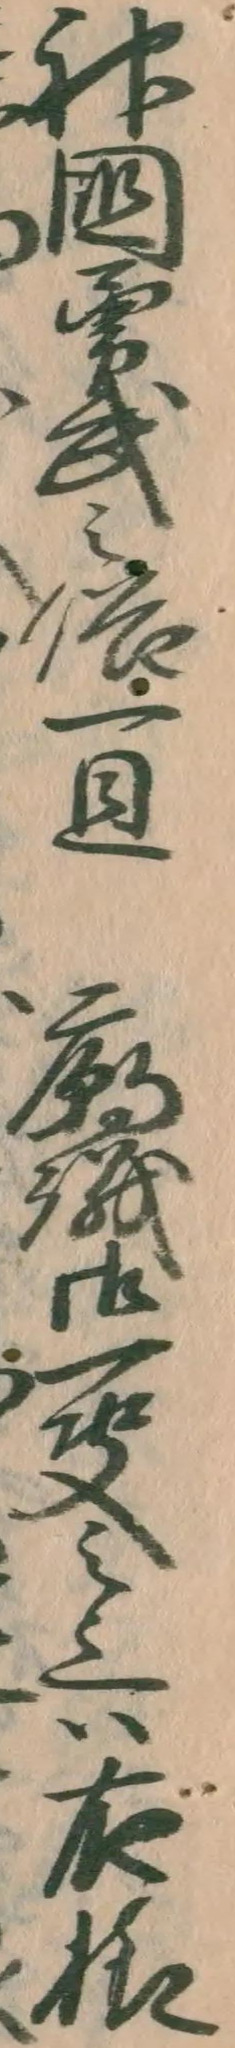神国勇武之俗一旦廟議御一決之上ハ左様
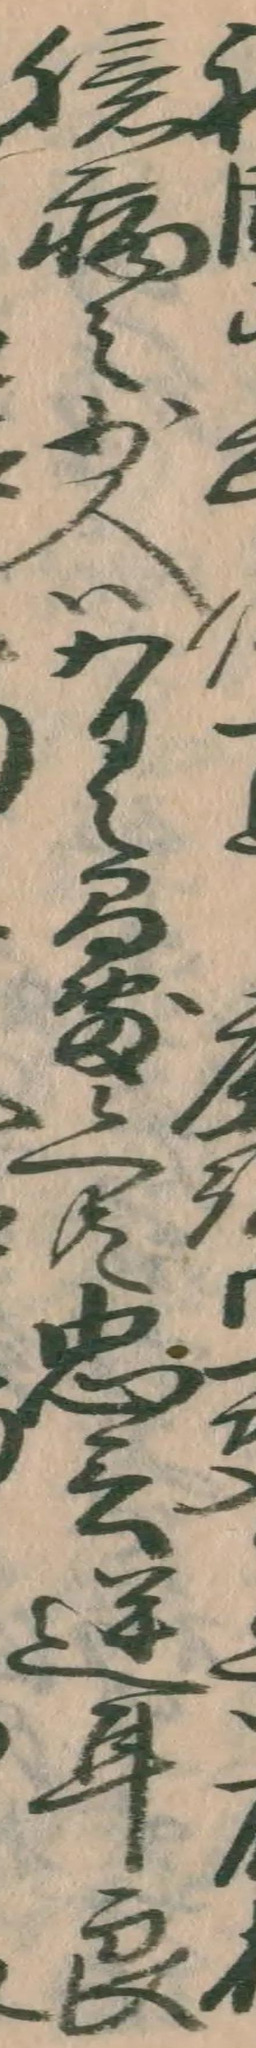臆病之少人ハ有之間敷候へ共忠言逆耳良
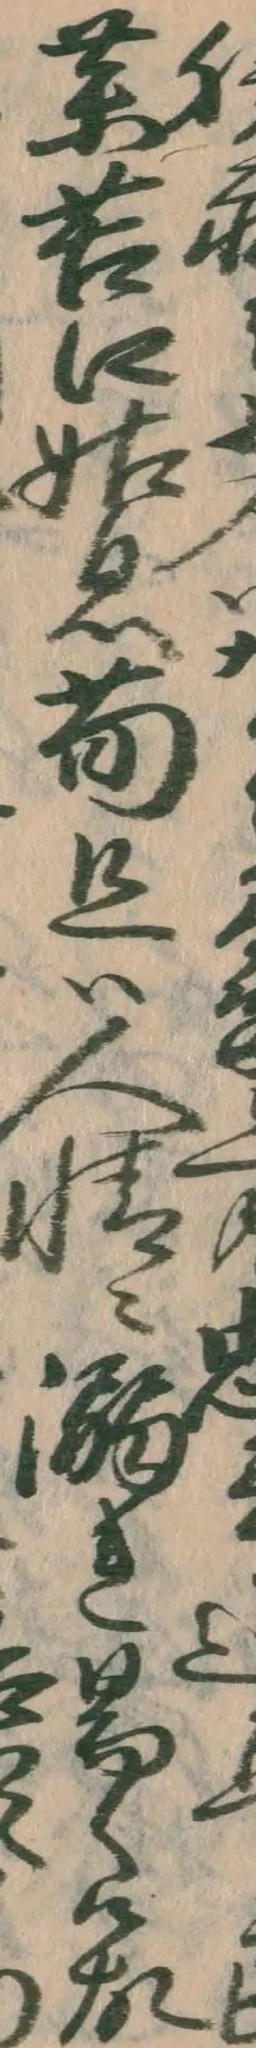薬苦口姑息苟且ハ人情ニ溺れ易く候故
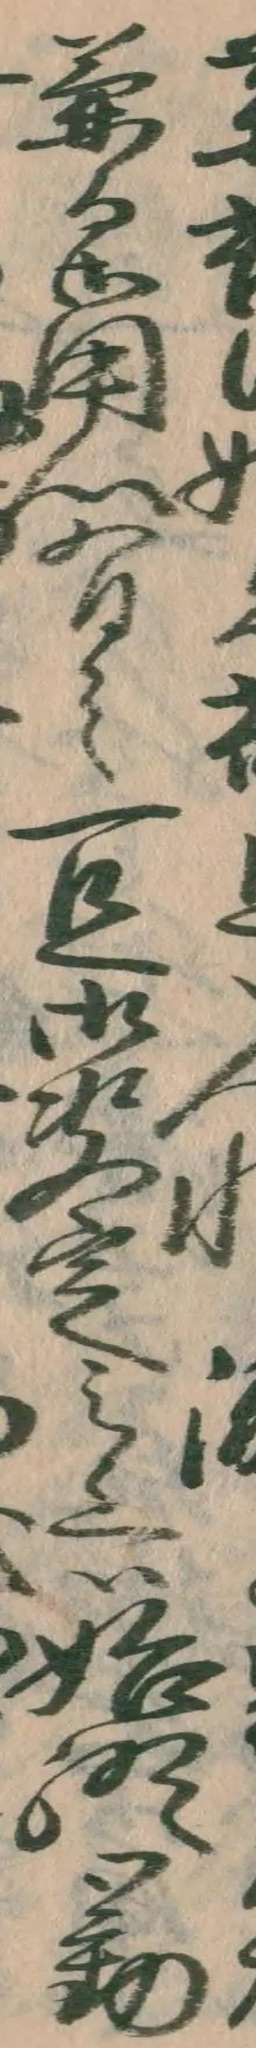兼而御用心有之一旦御決定之上ハ始終御動
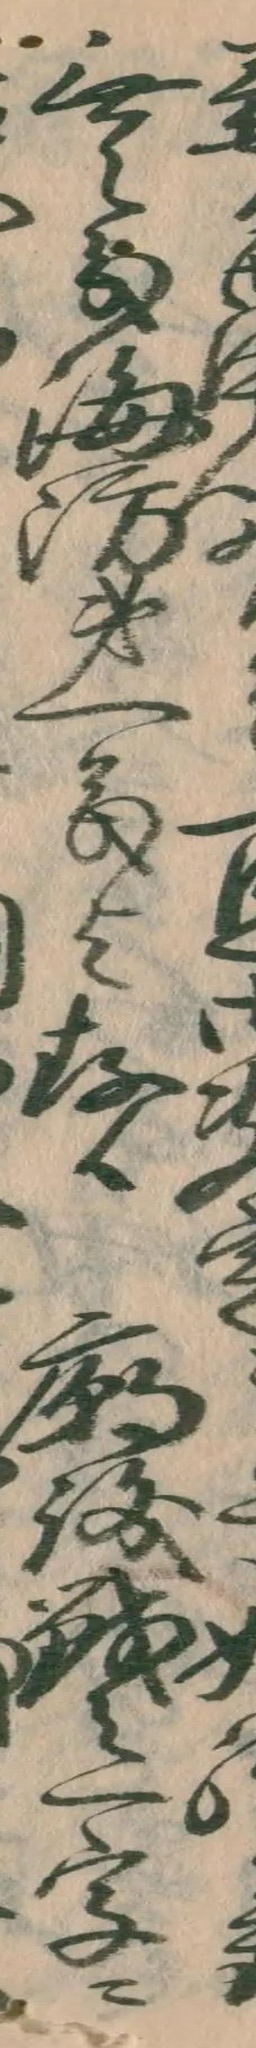無之義海防第一義と存候廟議戦之一字ニ
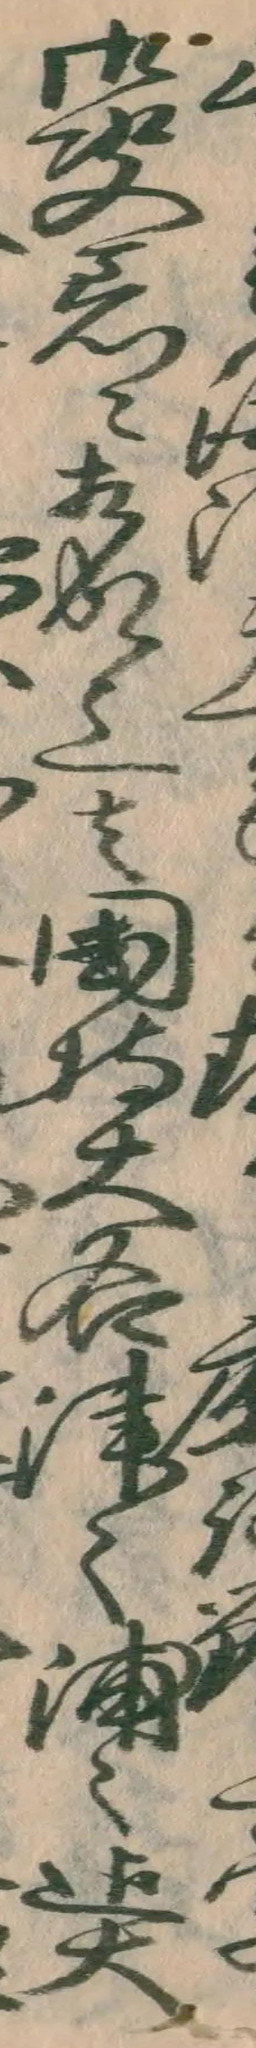御決着ニ相成候上者国持大名津々浦々迄大
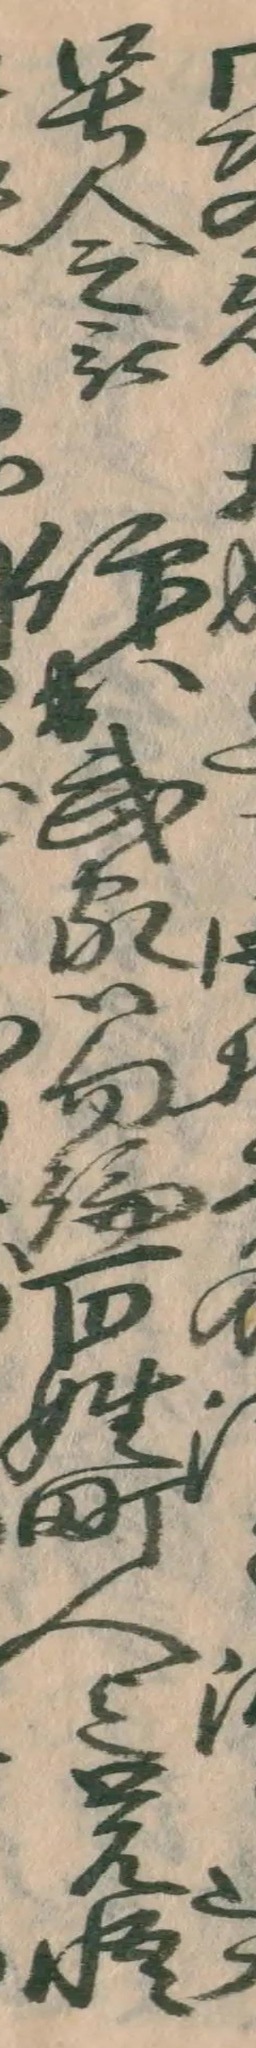号令被仰出武家ハ勿論百姓町人迄覚悟
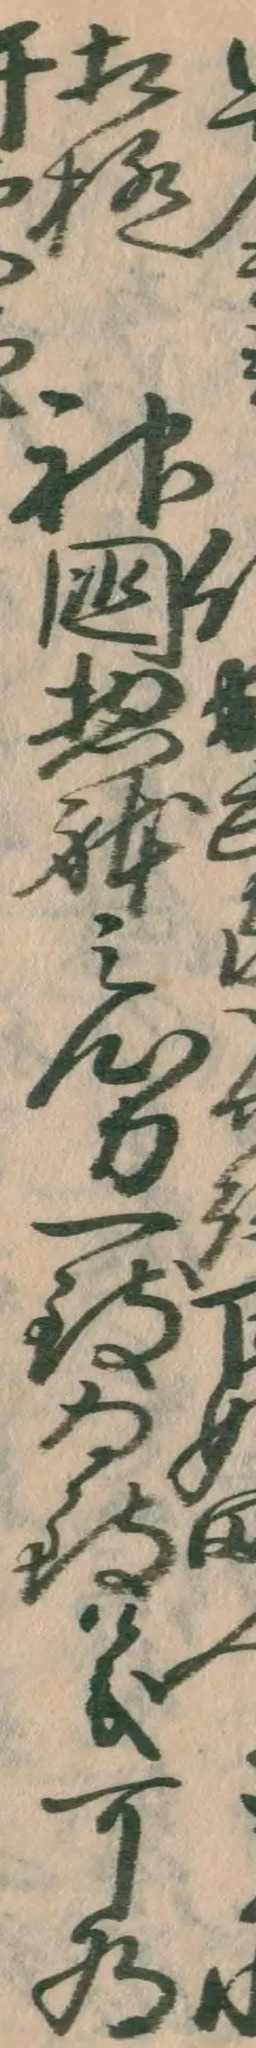相極神国惣躰之心力一致為致候義可為
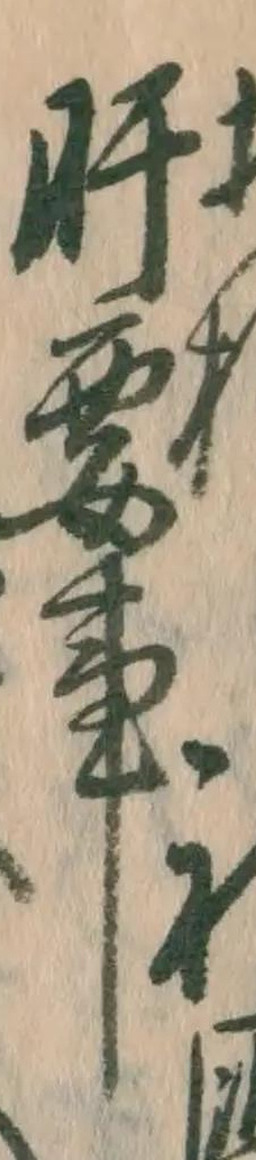肝要事
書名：麗斎叢書. 20
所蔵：国立国会図書館 National Diet Library, JAPAN
